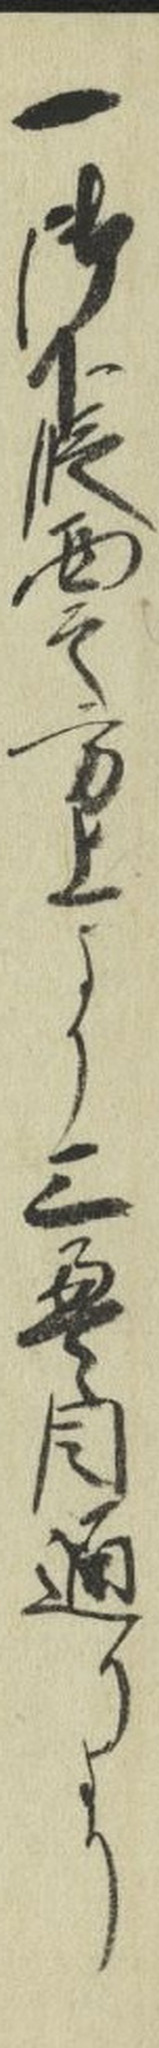一御下段西之方上より三畳目通りより
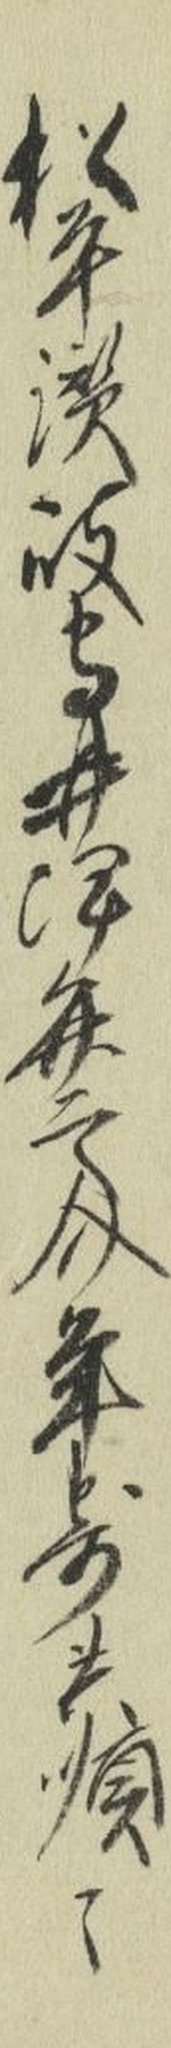松平讃岐守井伊弁二人年寄共順々
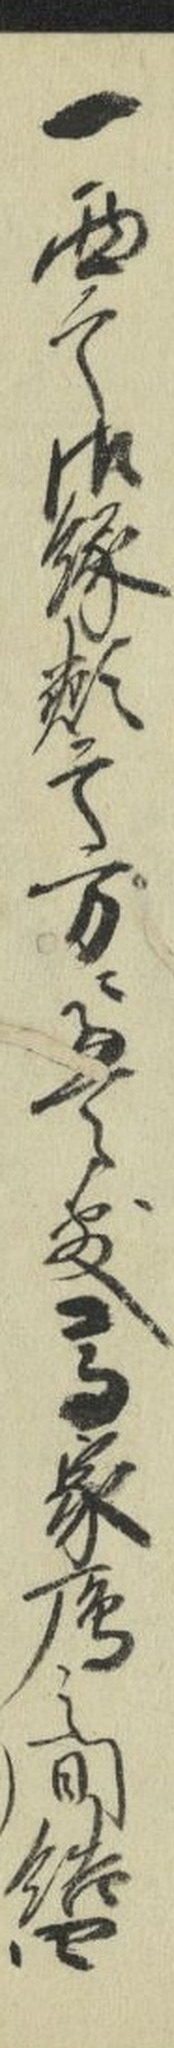一西之御縁頬之方に畳敷高家雁之間詰四
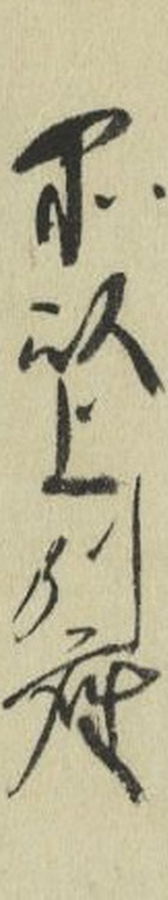品以上列座

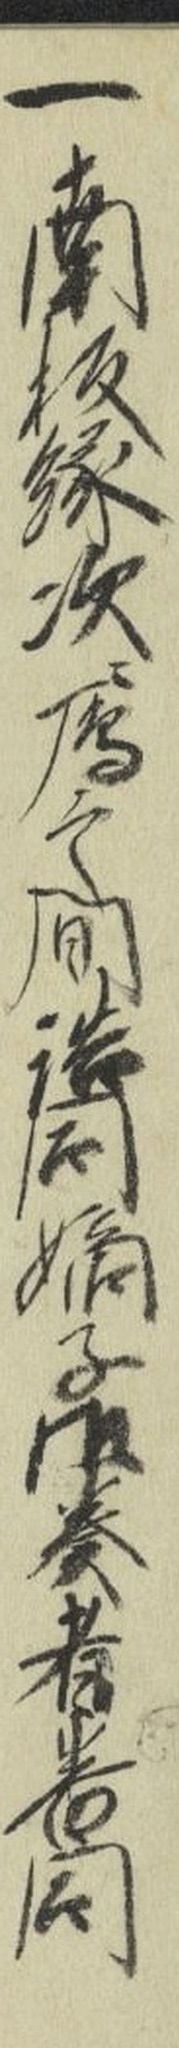一南板縁次に雁之間詰同嫡子御奏者番同
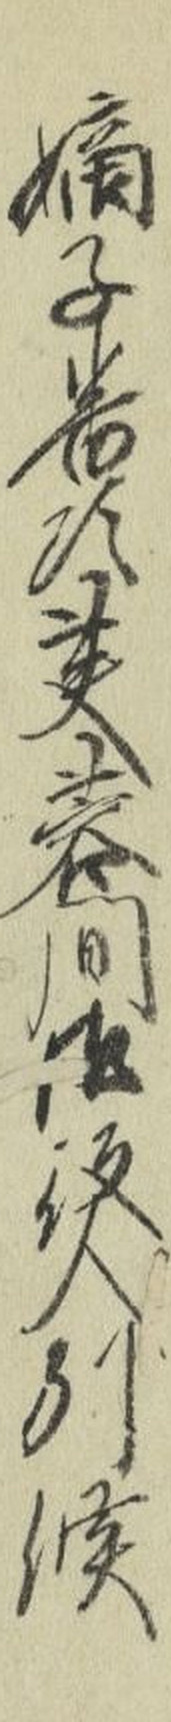嫡子番頭芙蓉間御役人列候
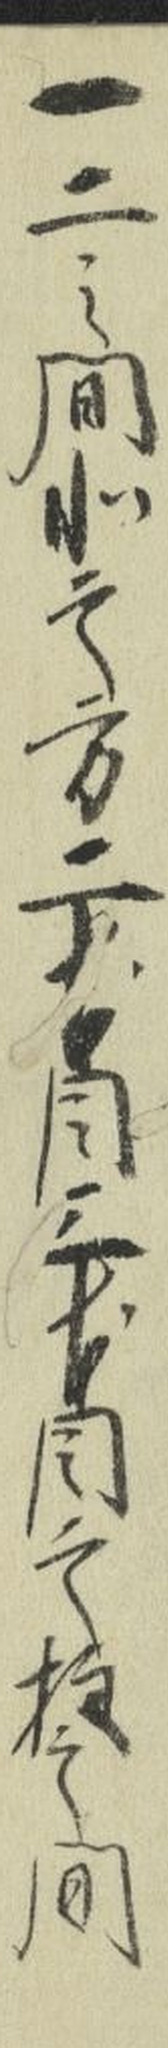一二之間北之方二本目三本目之柱之間
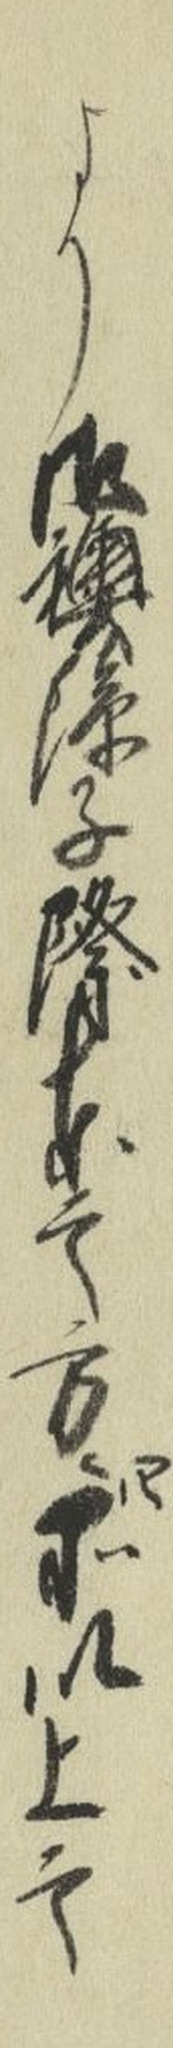より御襖障子際東之方に四品以上之
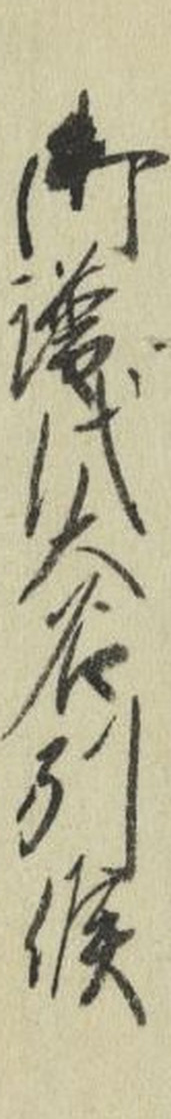御譜代大名列候
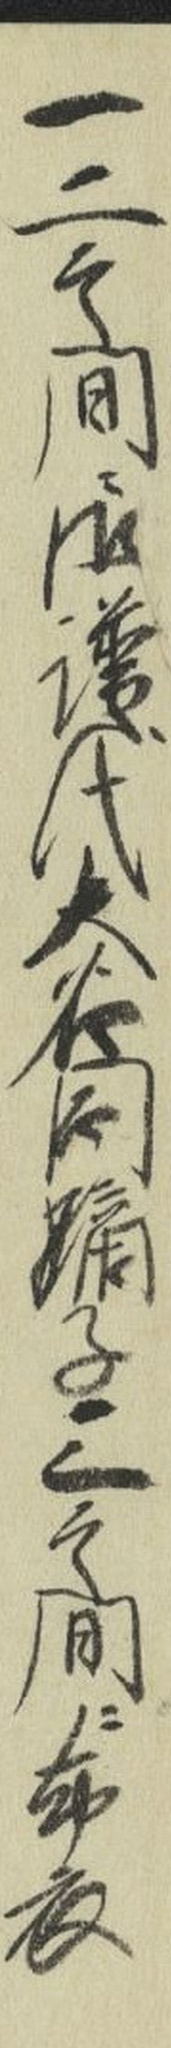一二之間に御譜代大名同嫡子三之間に布衣
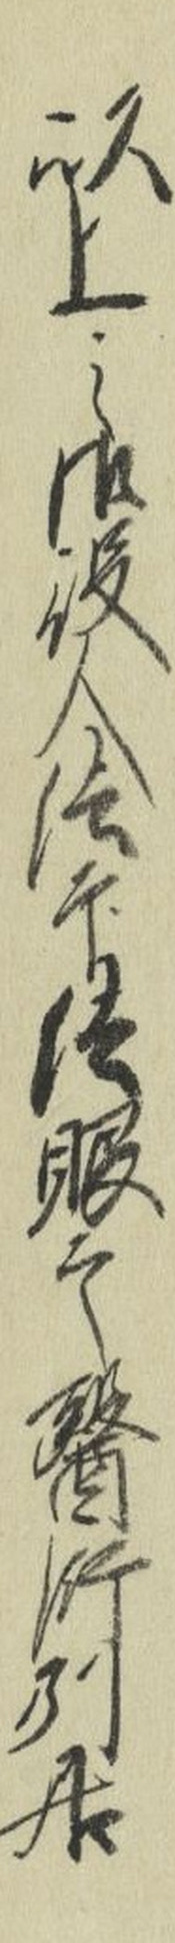以上之御役人法印法服之医師列居
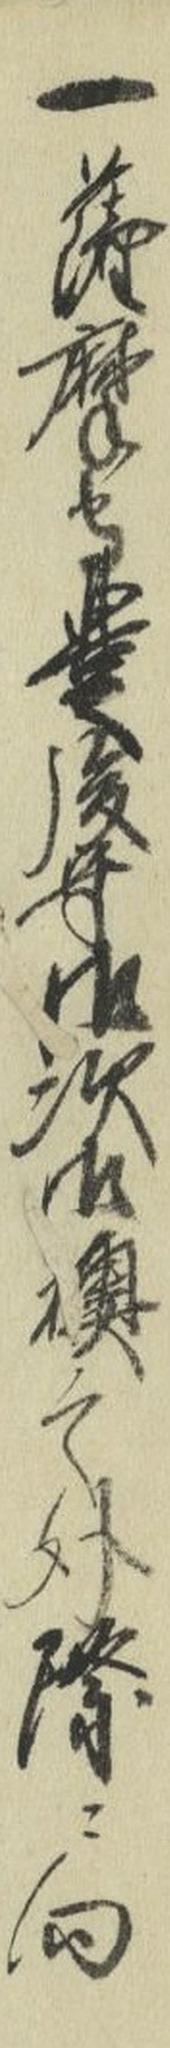一薩摩守豊後守御次御襖之外際に向
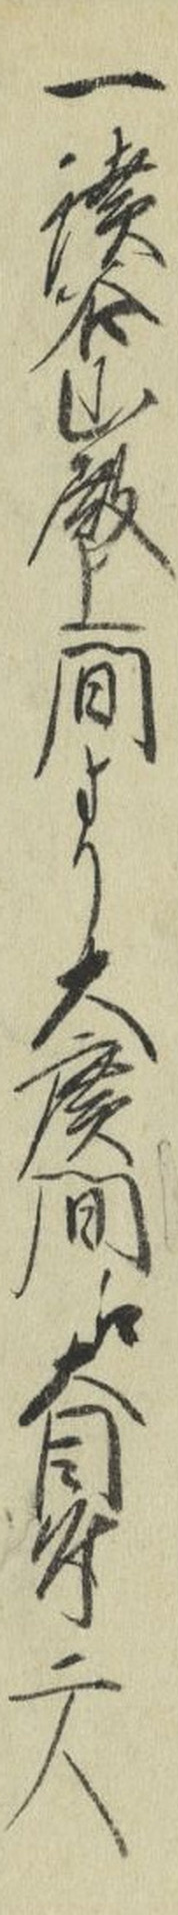一読谷山殿上間より大広間え大目付二人

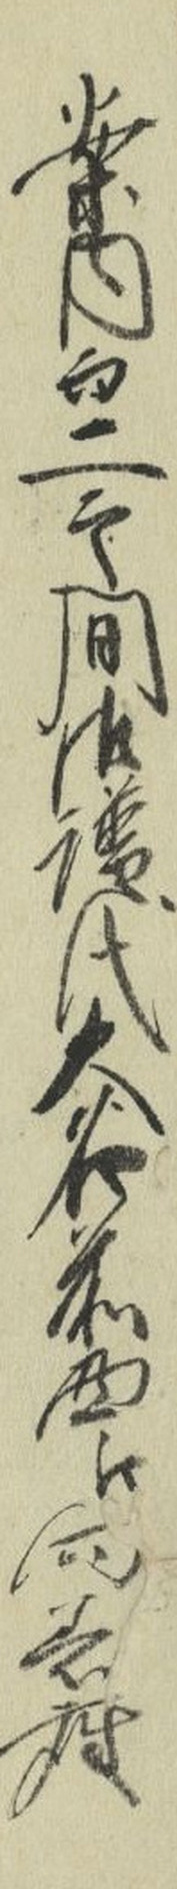案内而二之間御譜代大名前え向着座
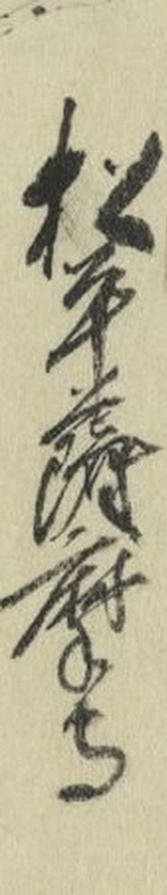松平薩摩守
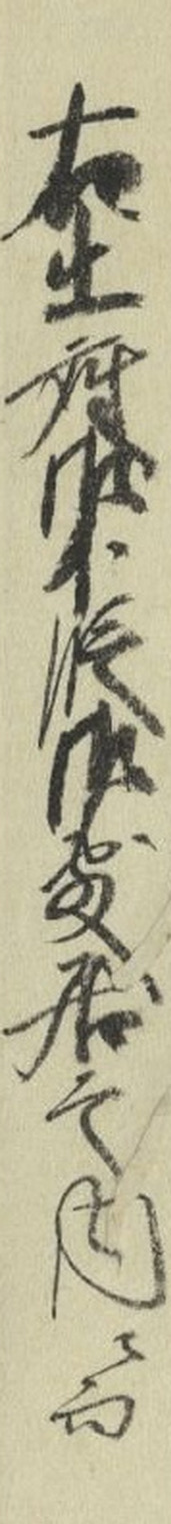右出座御下段御敷居之内に而
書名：琉球人御礼の次第
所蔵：University of the Ryukyus Library
